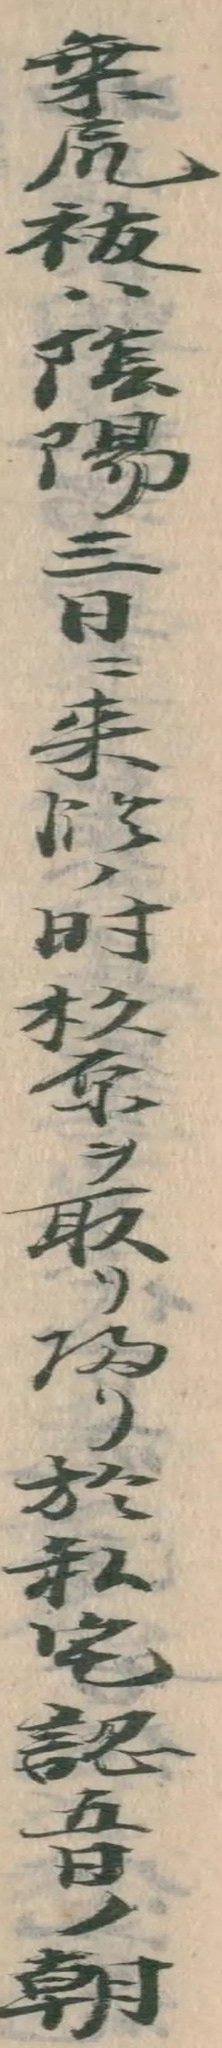乗尻祓ハ陰陽三日ニ来臨ノ時杉原ヲ取リ帰リ於私宅認五日ノ朝
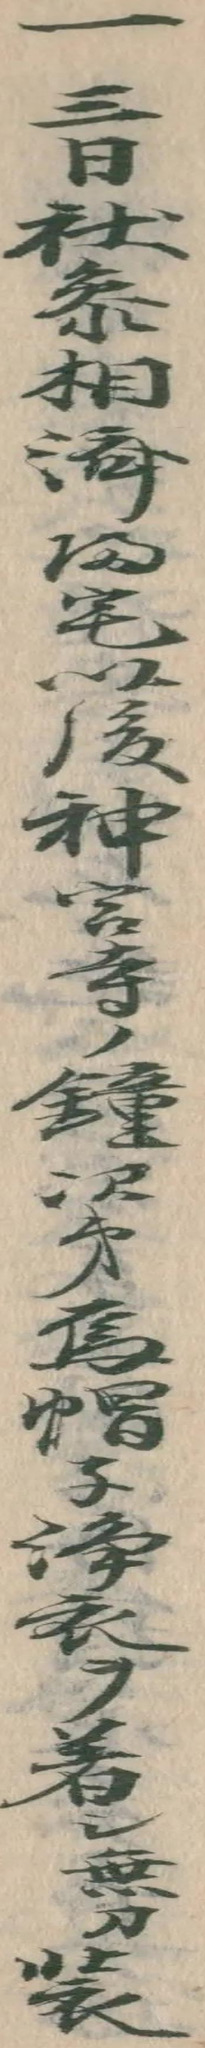一三日社参相済帰宅以後神宮寺ノ鐘次第烏帽子浄衣ヲ着シ無刀装
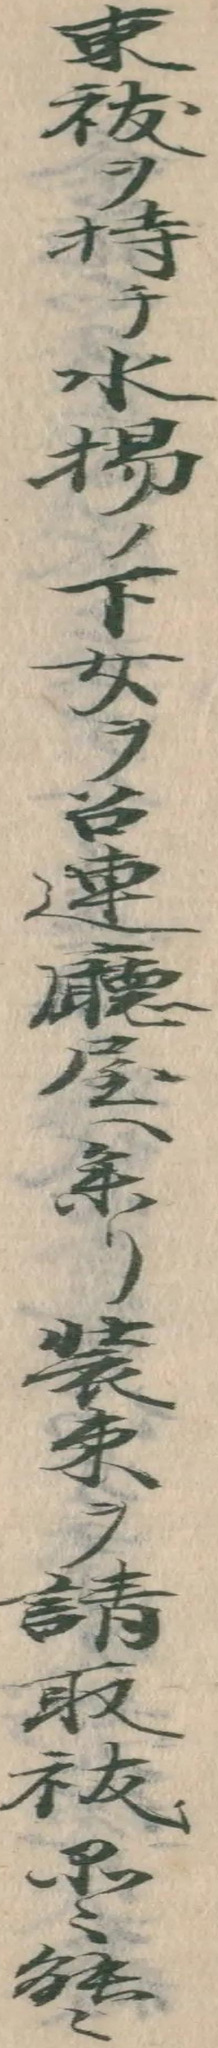束祓ヲ持チ水揚ノ下女ヲ召連庁屋へ参リ装束ヲ請取祓品々能々
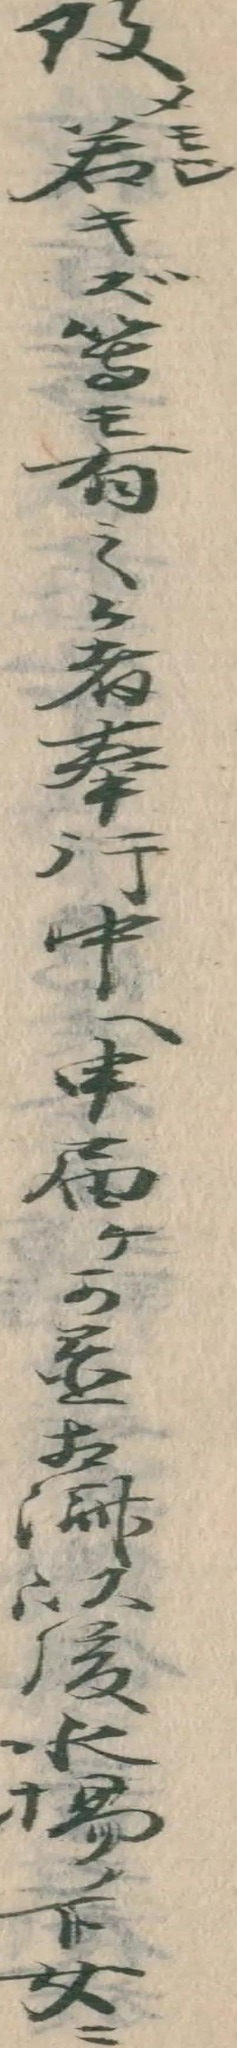改メ若キズ等モ有之候者奉行中へ申届ケ可置相済以後水揚ノ下女ニ
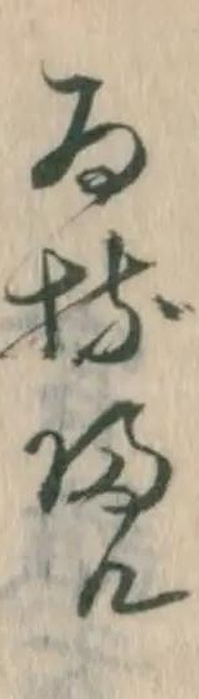為持帰ル
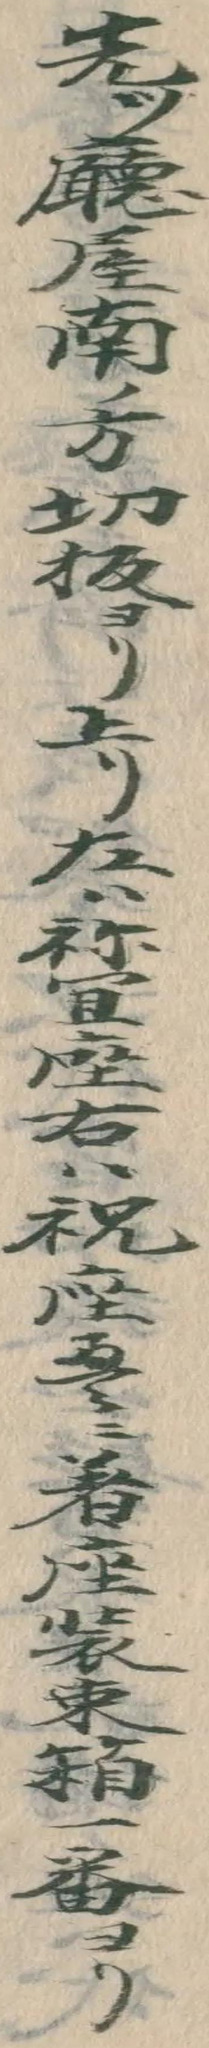先ツ庁屋南ノ方切板ヨリ上リ左ハ禰宜座右ハ祝座畳ニ着座装束箱一番ヨリ
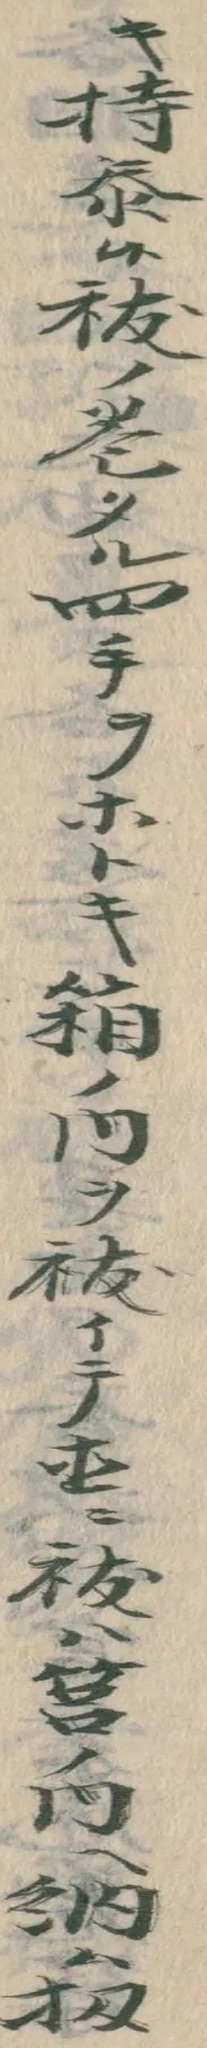キ持参候祓ノ巻タル四手ヲホトキ箱ノ内ヲ祓イテ直ニ祓ハ筥ノ内ヘ納ム扨
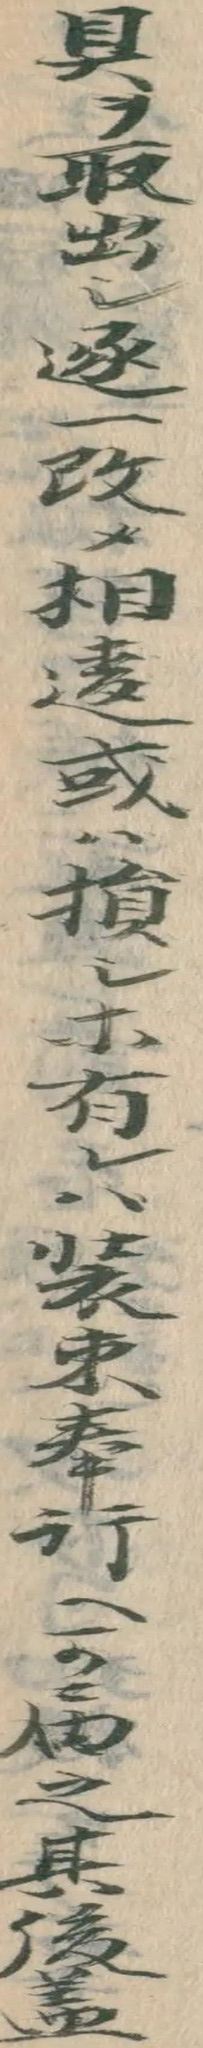具ヲ取出シ逐一改メ相違或ハ損シ等有レハ装束奉行ヘ可届之其後蓋

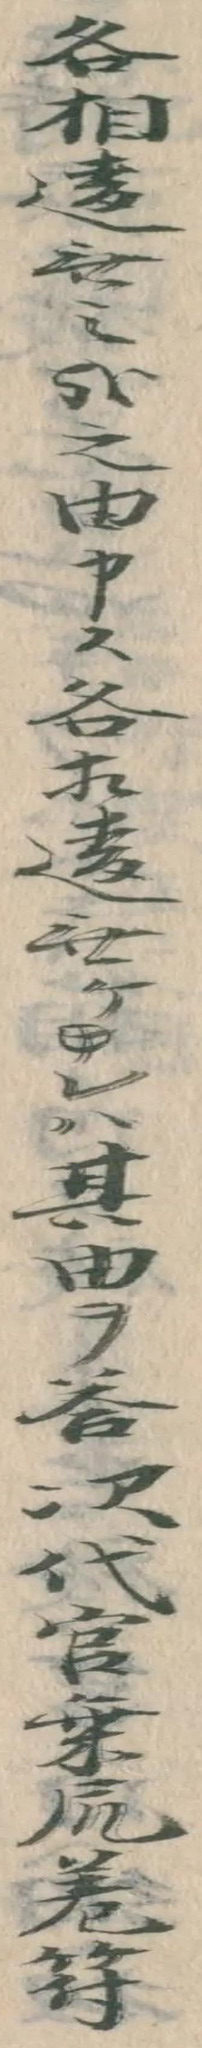各相違無之哉之由申ス各相違無ケレハ其由ヲ答次代官乗尻差符
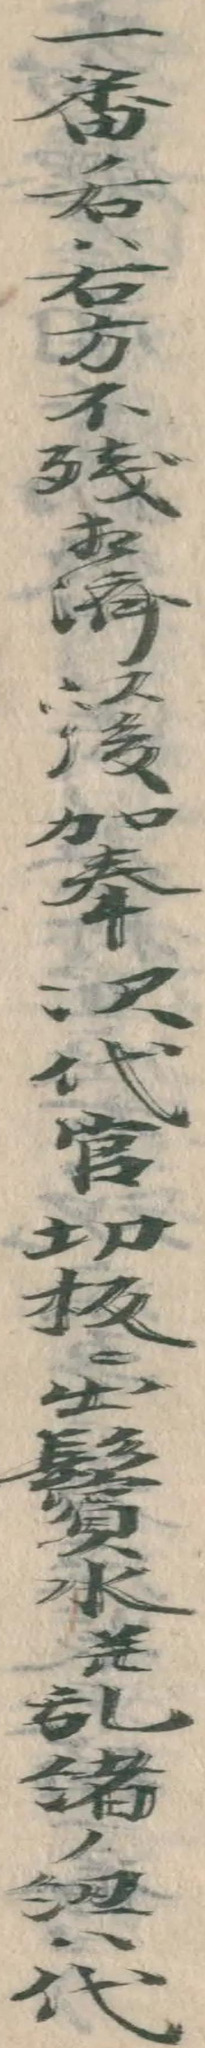一番ノ右ハ右方不残相済以後加奉次代官切板ニ出鬢水并乱緒ノ紐ハ代
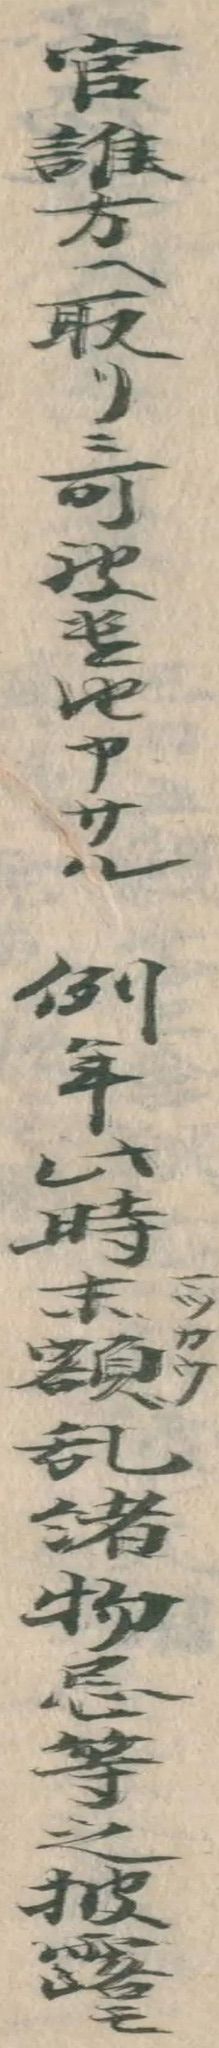官誰方ヘ取リニ可被遣由申サル例年此時末額乱緒物忌等之披露モ
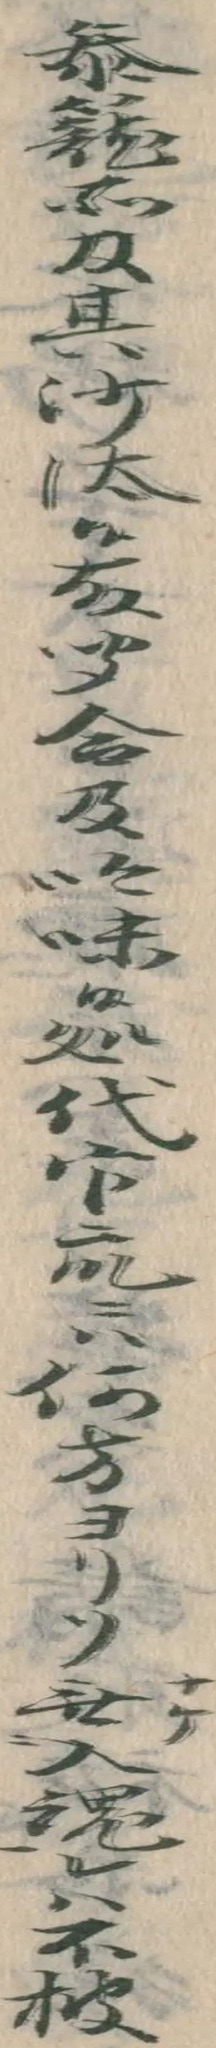参籠所及其沙汰候故聞合及吟味候処代官衆ニハ何方ヨリソ無入魂レハ不披
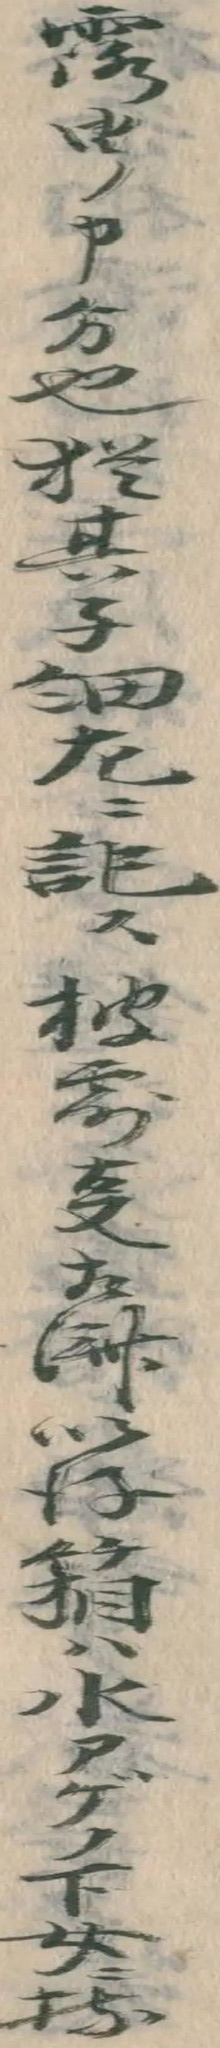露由ノ申分也猶其子細左ニ記ス披露事相済以後箱ハ水アゲノ下女ニ持
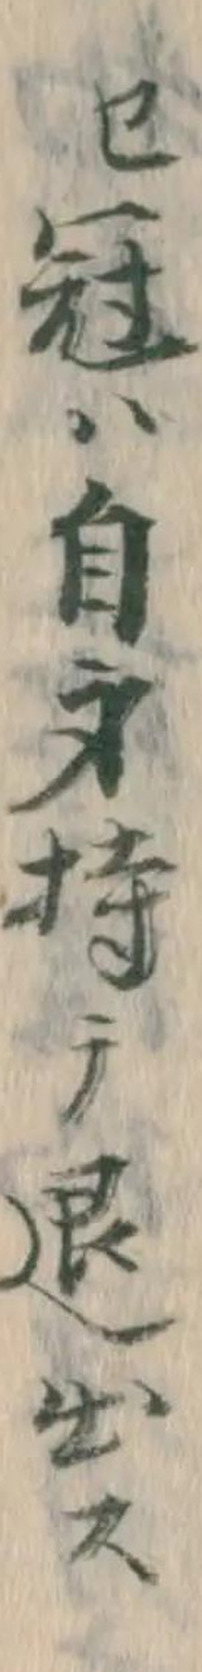セ冠ハ自身持テ退出ス
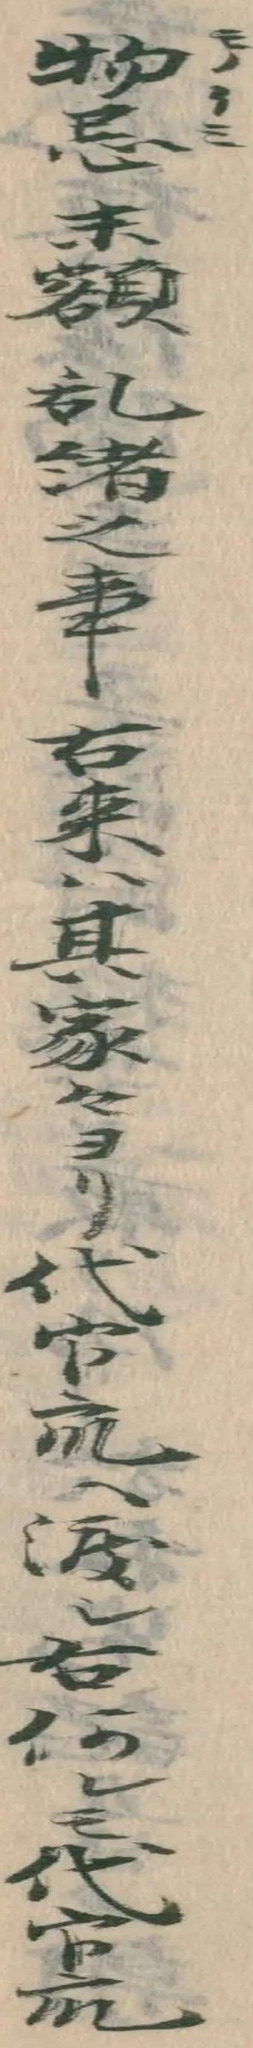物忌末額乱緒之事古来ハ其家々ヨリ代官衆ヘ渡シ右何レモ代官衆
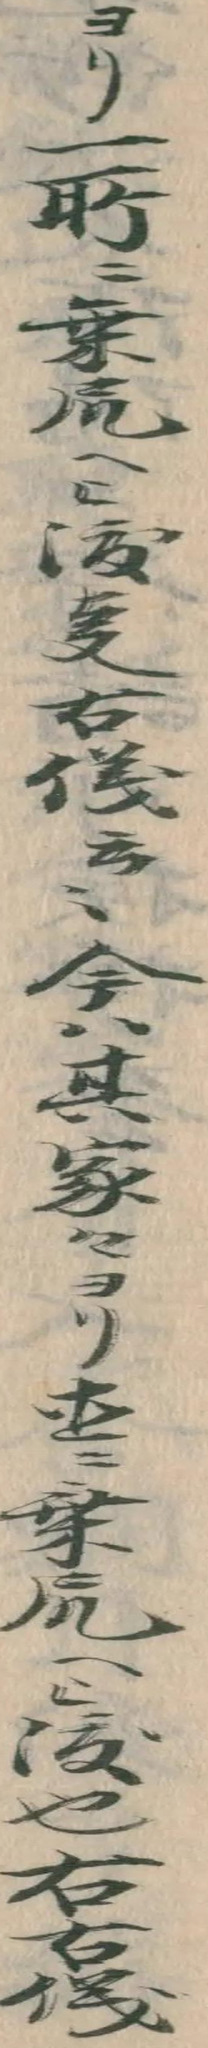ヨリ一所ニ乗尻へ被渡事古儀云々今ハ其家々ヨリ直ニ乗尻へ被渡也右古儀
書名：賀茂社記録. 第11冊
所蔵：国立国会図書館 National Diet Library, JAPAN
